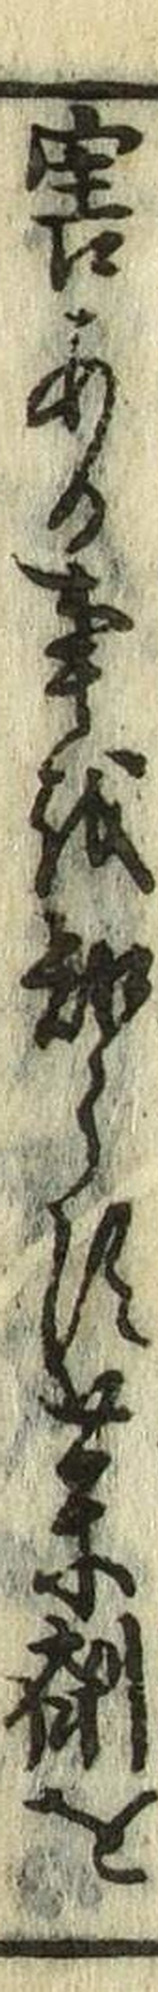害ある事を知らす薬剤を
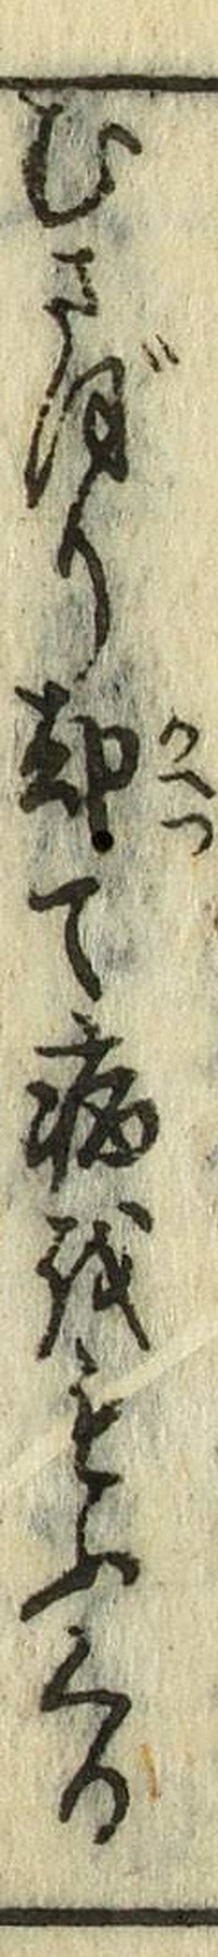むさぼり却て病をもふくる
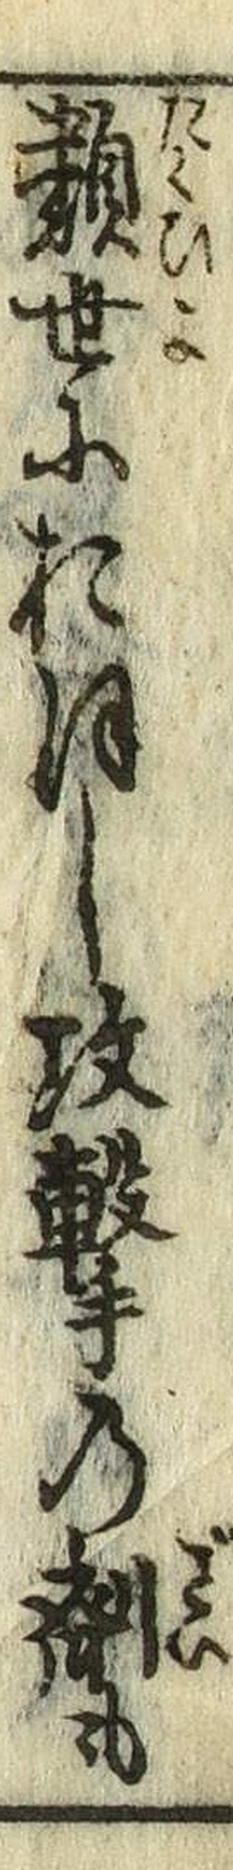類世におほし攻撃の剤も
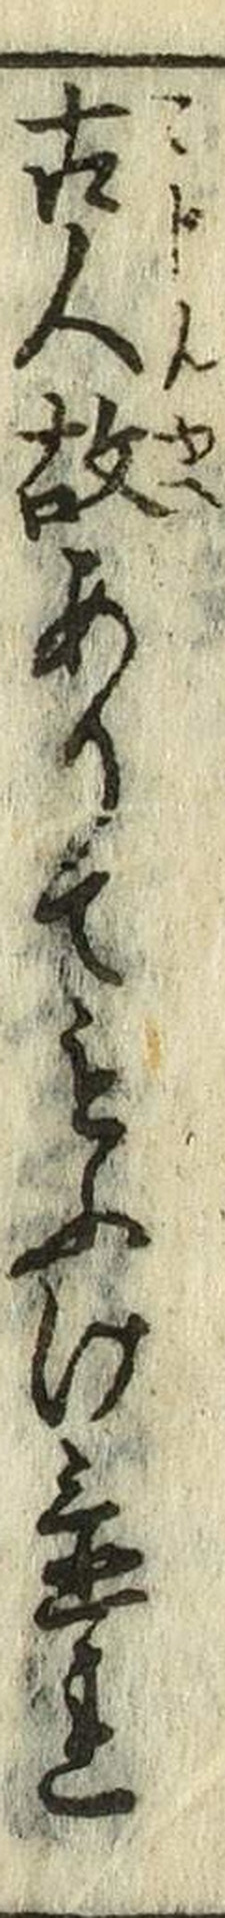古人故ありてもふけ置れ
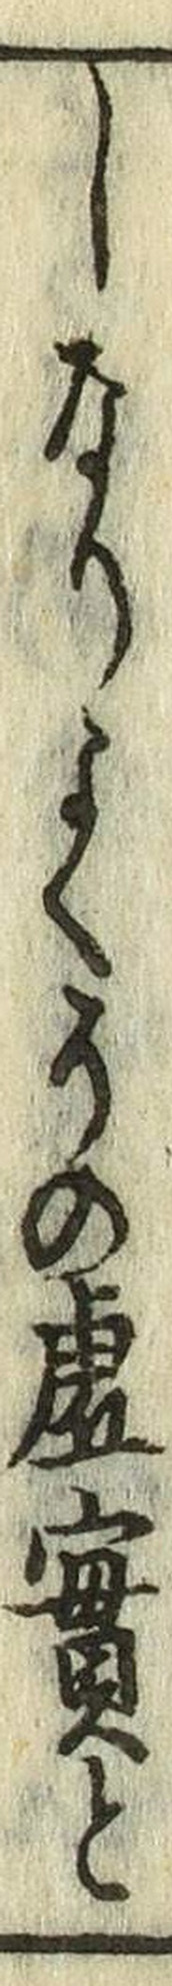しなりよくその虚実と
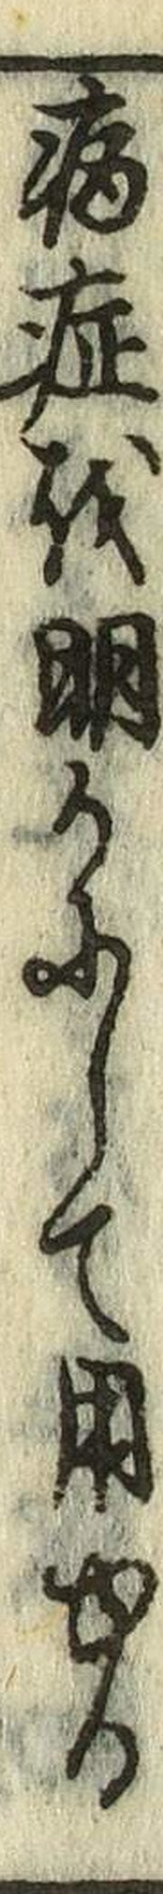病床を明かにして用ゆる
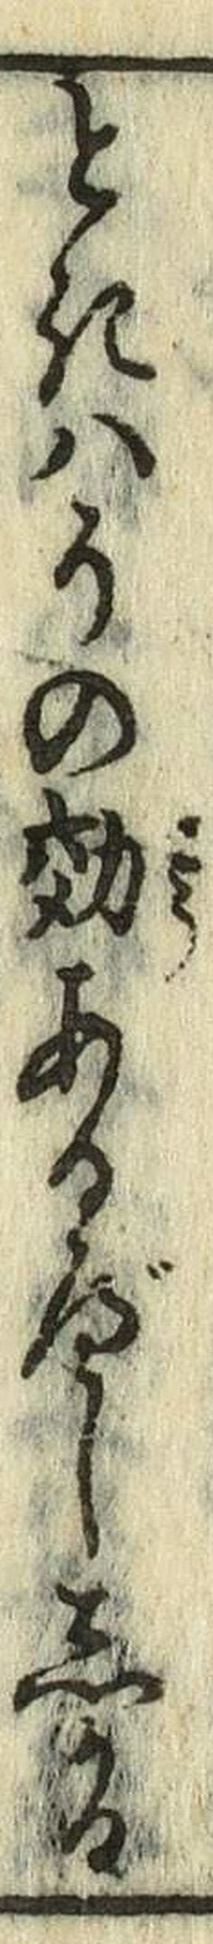ときはその効あるべししかる
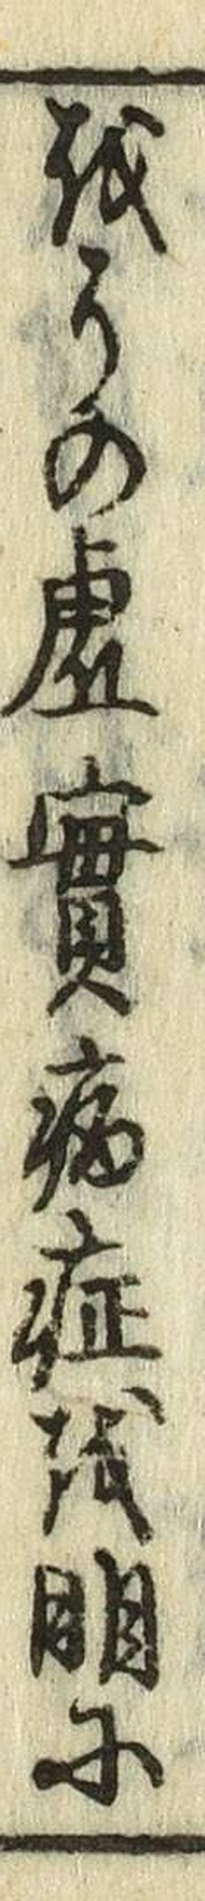をその虚実病症を明に
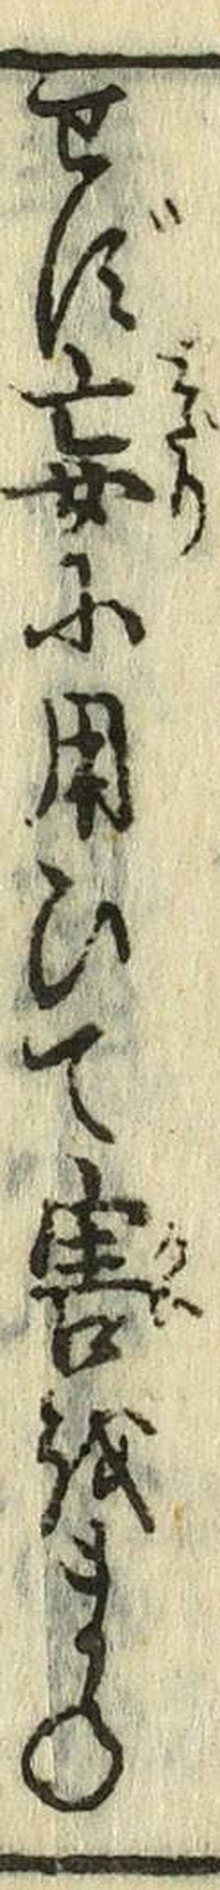せず妄に用ひて害をまね
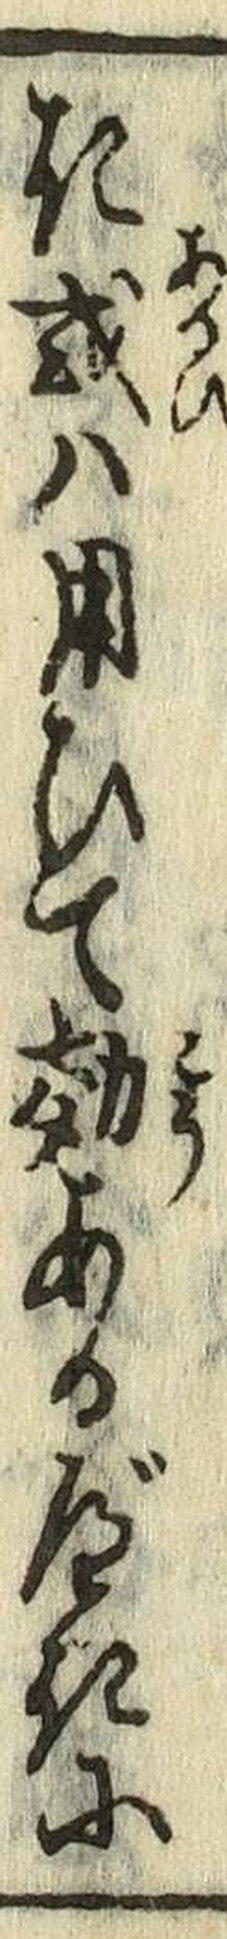き或は用ひて効あるべきに
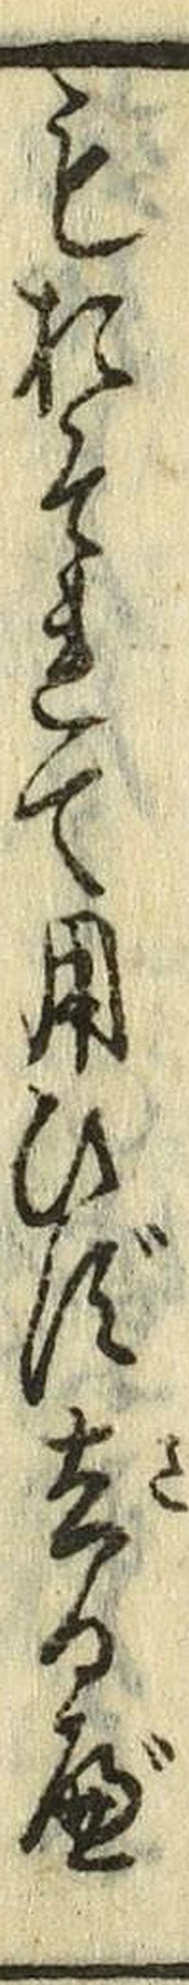もおそれて用ひず去るべ
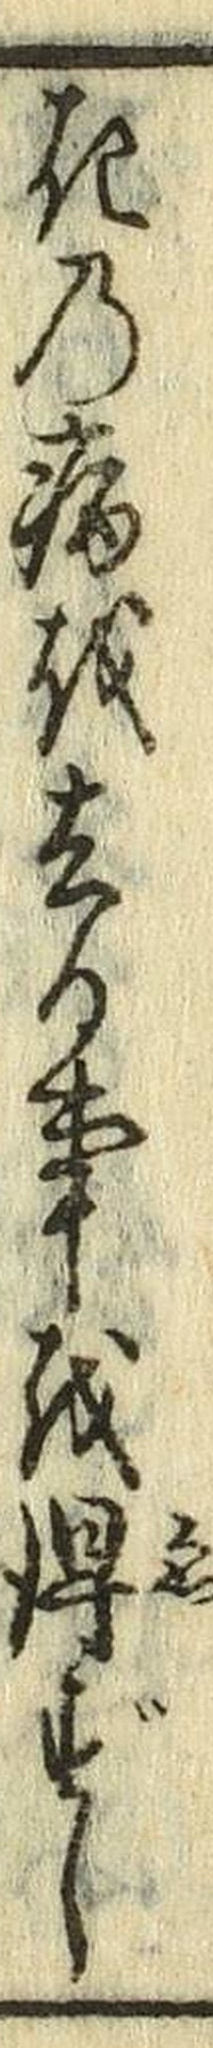きの病を去る事を得ずし
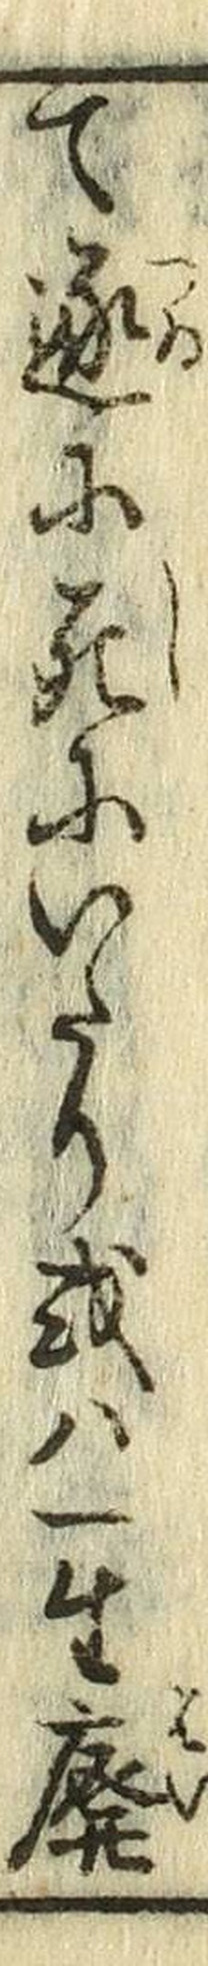て遂に死にいたり或は一生廃
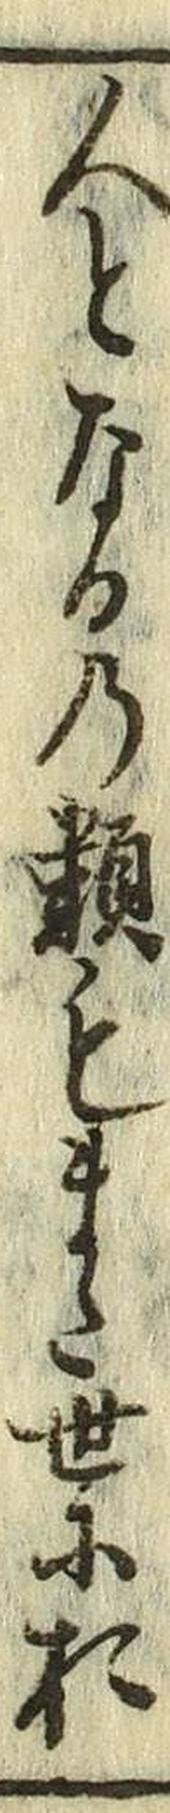人となるの類もまた世にお
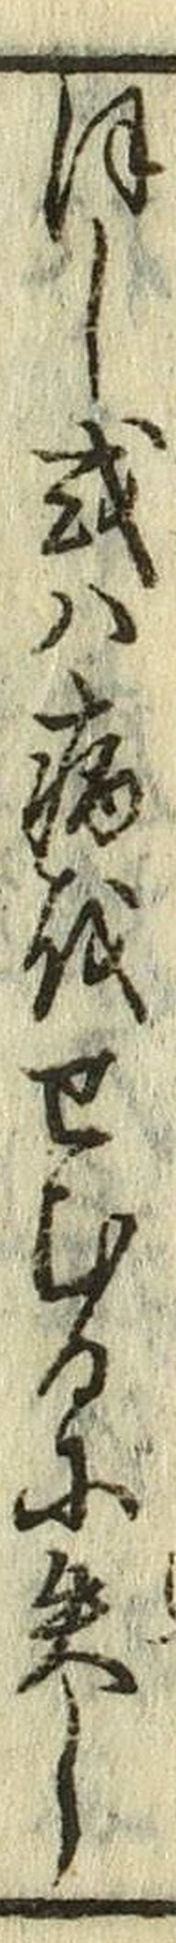ほし或は病をせむるに失し
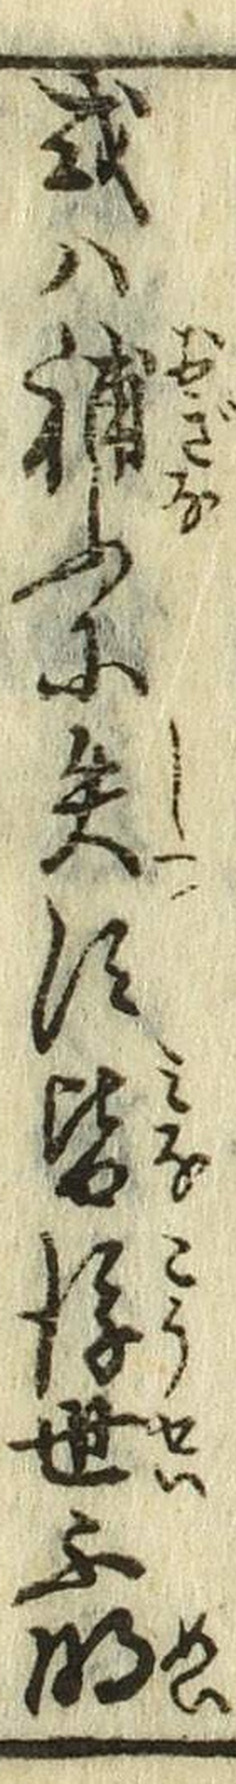或は補ふに失す皆後世不明
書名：居家養生記
